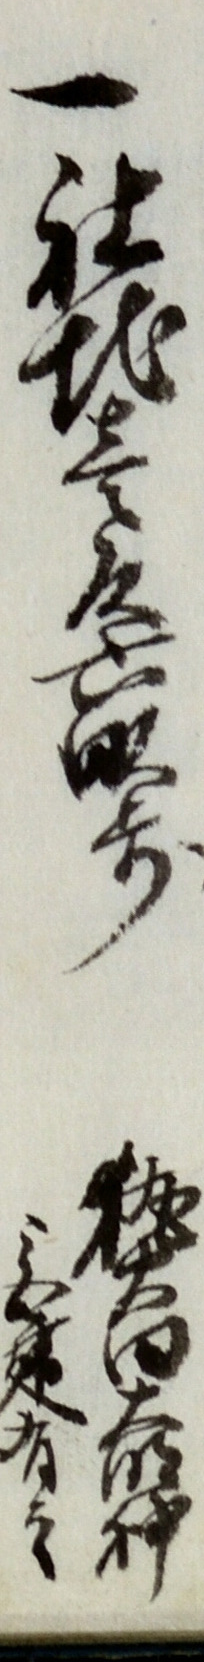一社地壱反六畝歩熱田大明神
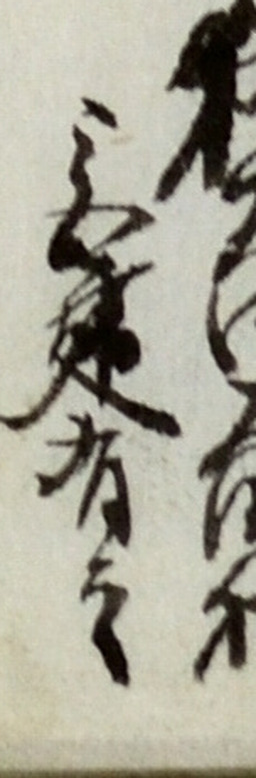宮建有之

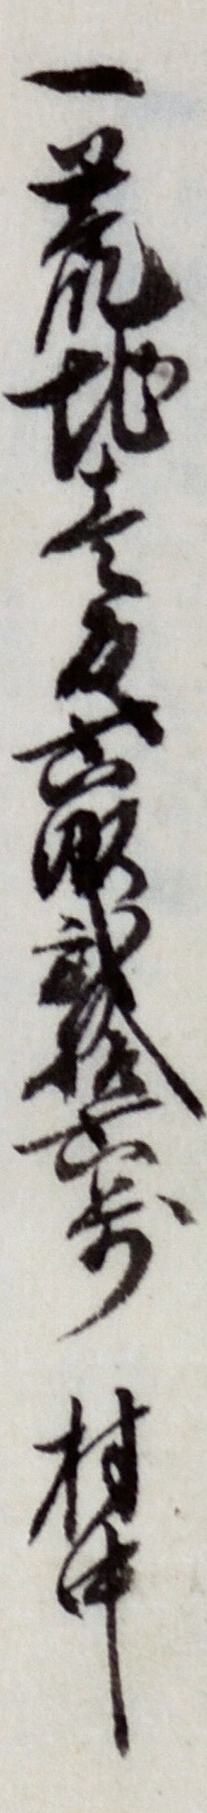一荒地壱反六畝弐拾六歩村中
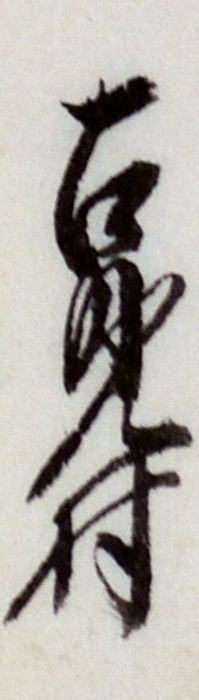古見村
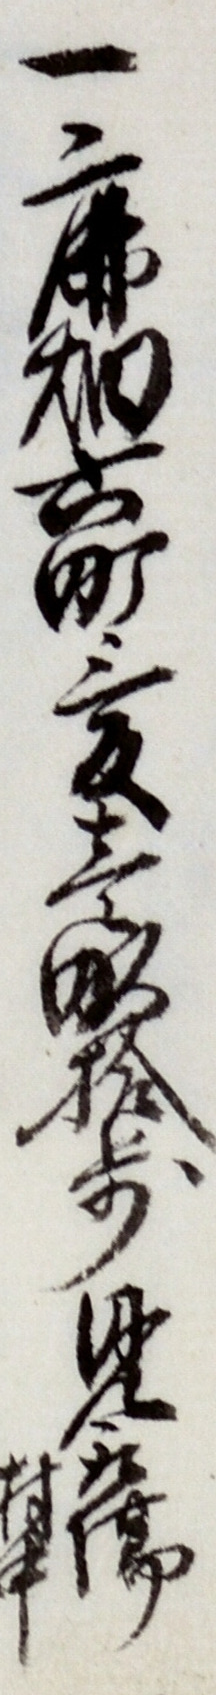一麻畑六町三反壱畝拾歩見取場
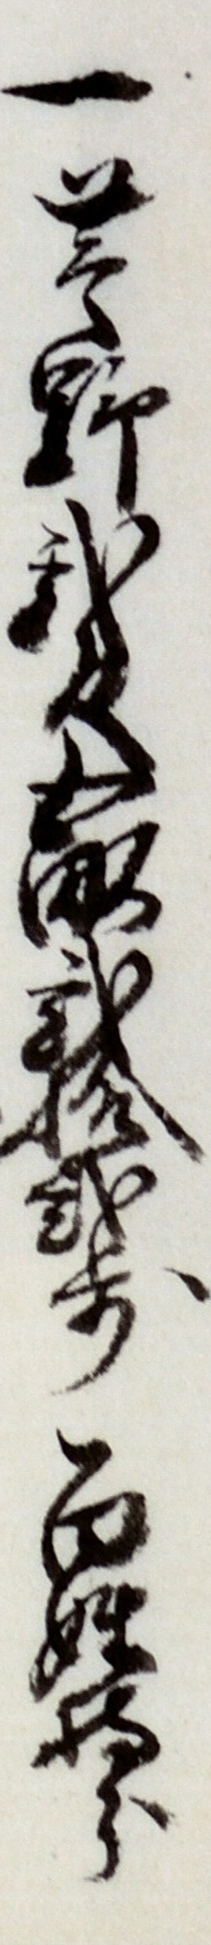一芝野弐反五畝弐拾弐歩百姓持分
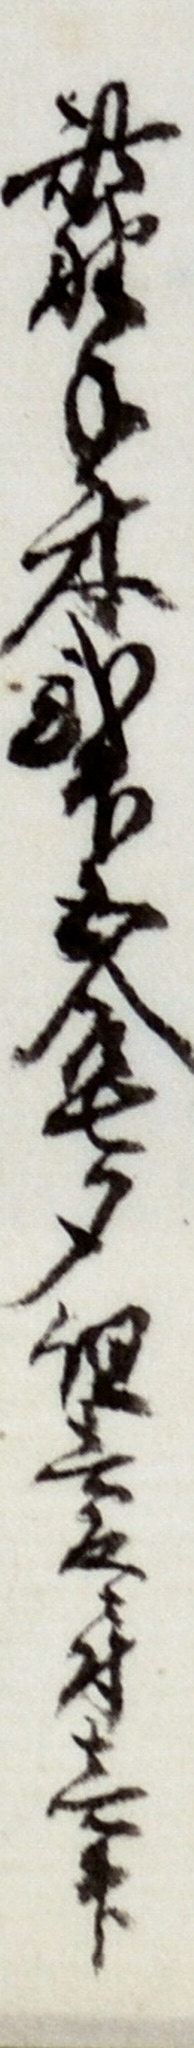此野手米弐升五合七勺但壱反ニ付壱升
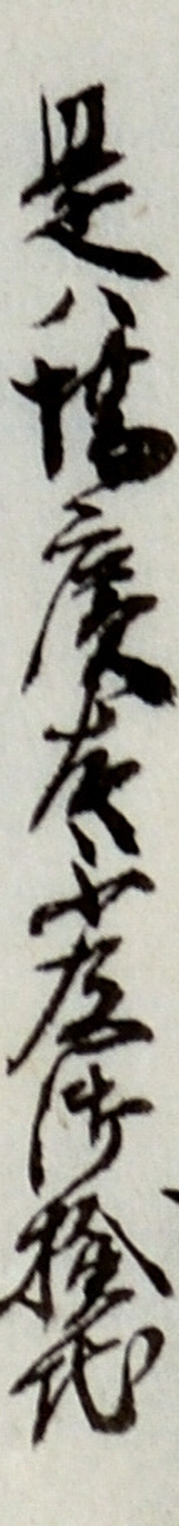是ハ場広故不及御検地
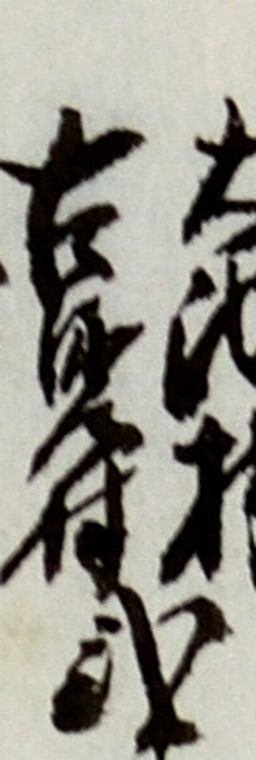古見村
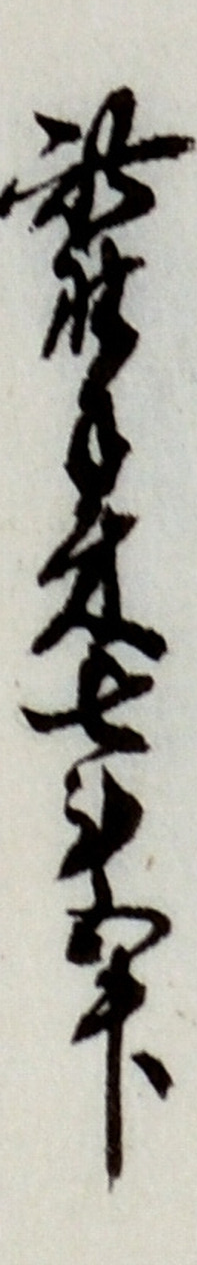此野手米七斗五升
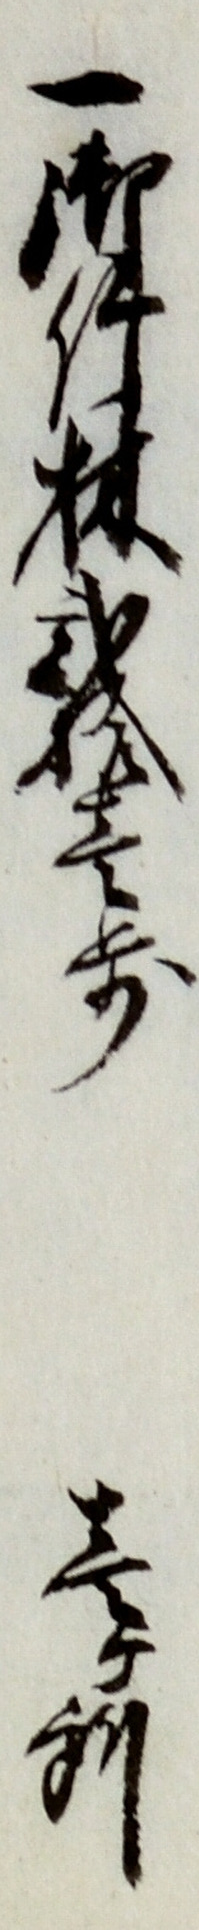一御竹林弐拾壱歩壱ヶ所
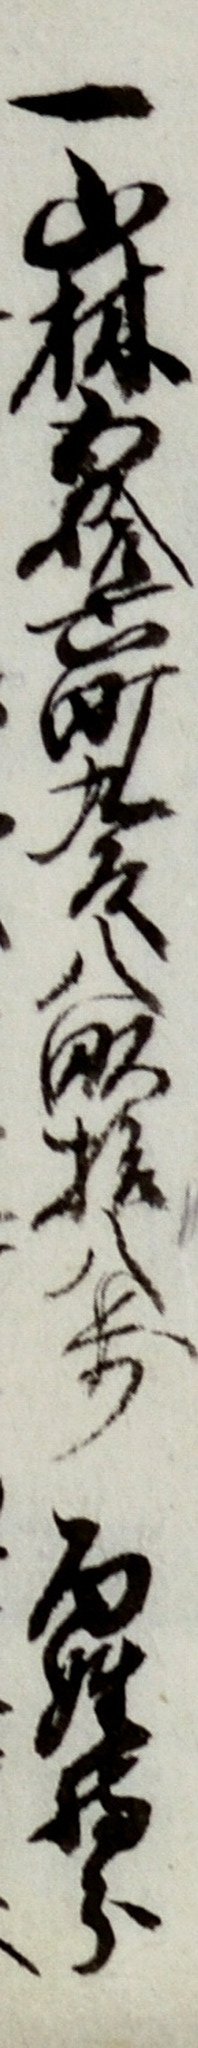一山林五拾六町九反八畝拾八歩百姓持分
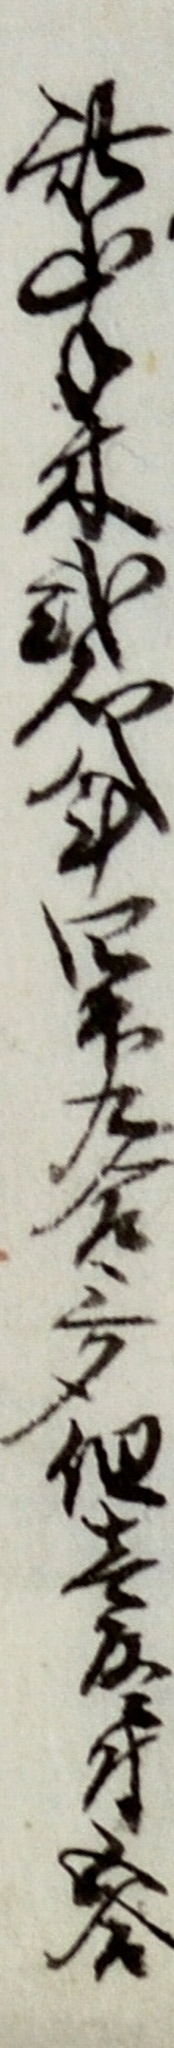此山手米弐石八斗四升九合三勺但壱反ニ付五合

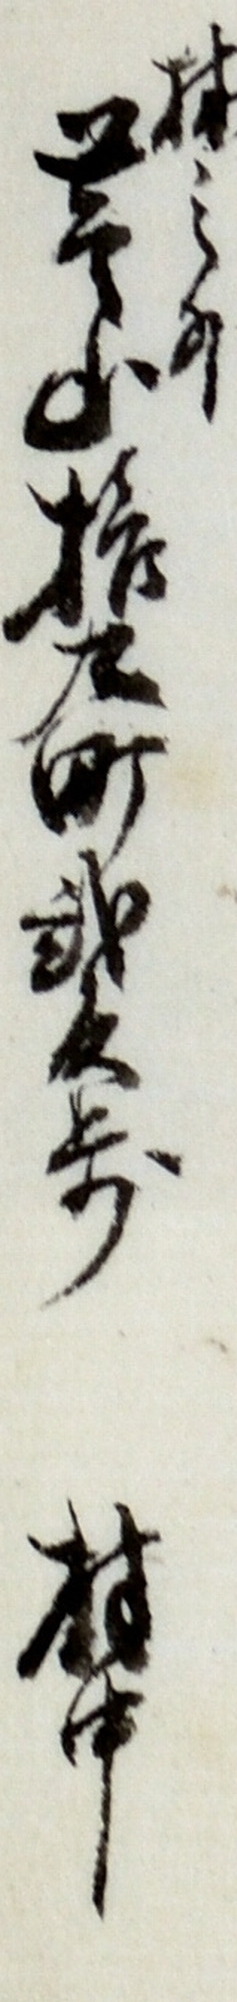芝山拾九町弐反歩村中
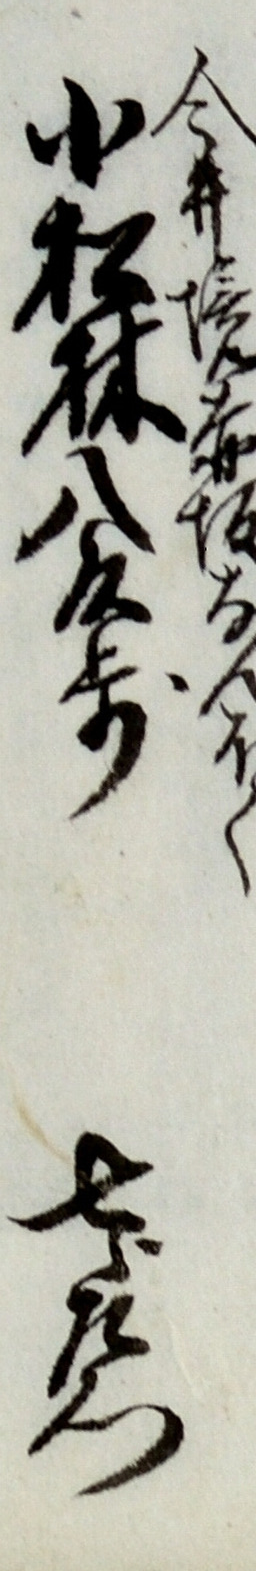小松林八反歩七郎左衛門

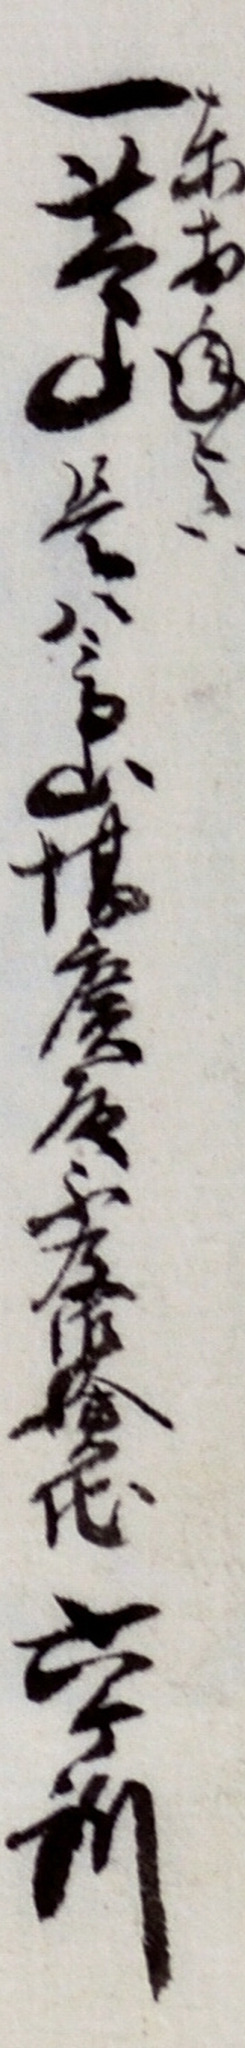一芝山是ハ高山場広故不及御検地六ヶ所
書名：御領分中山林社地手控
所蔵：伊那市立高遠町図書館・合同会社AMANE
